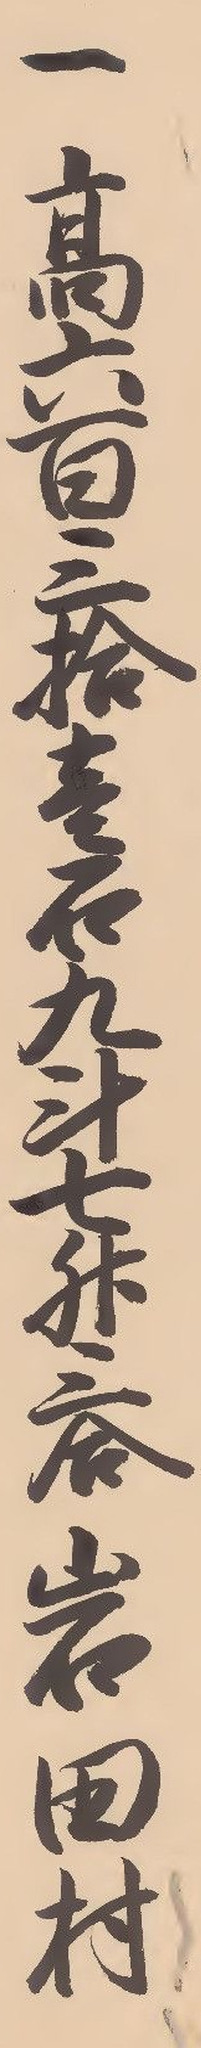一髙六百三拾壱石九斗七升三合岩田村
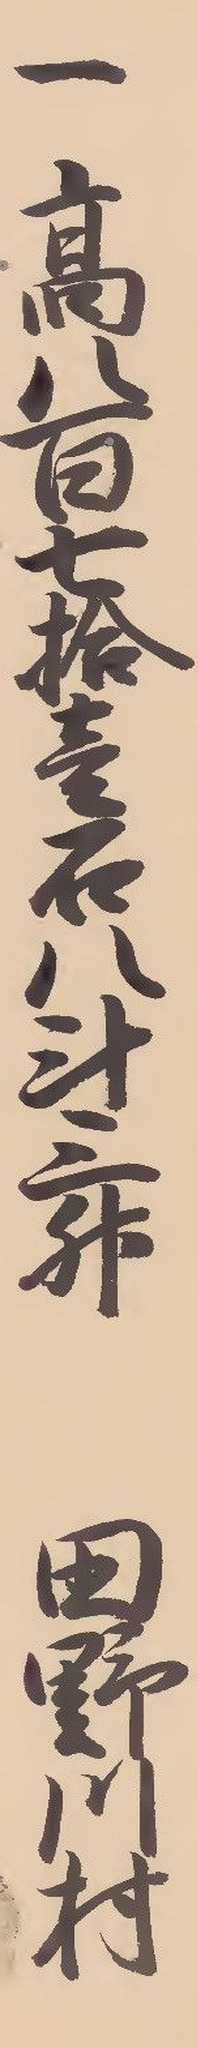一髙八百七拾壱石八斗三升田野川村

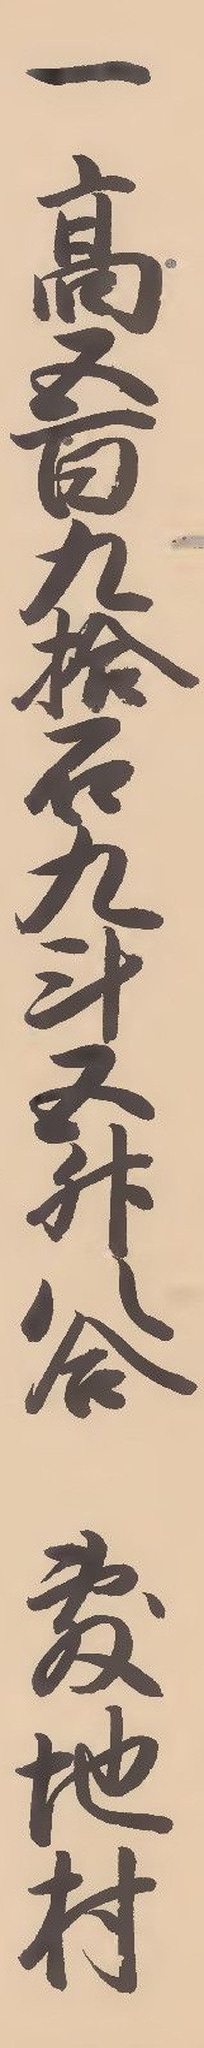一髙五百九拾石九斗五升八合敷地村
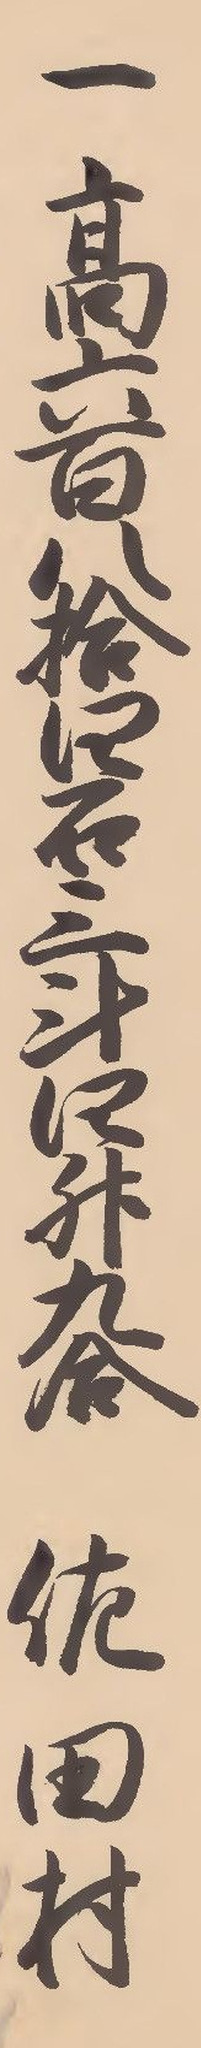一髙六百八拾四石三斗四升九合佐田村
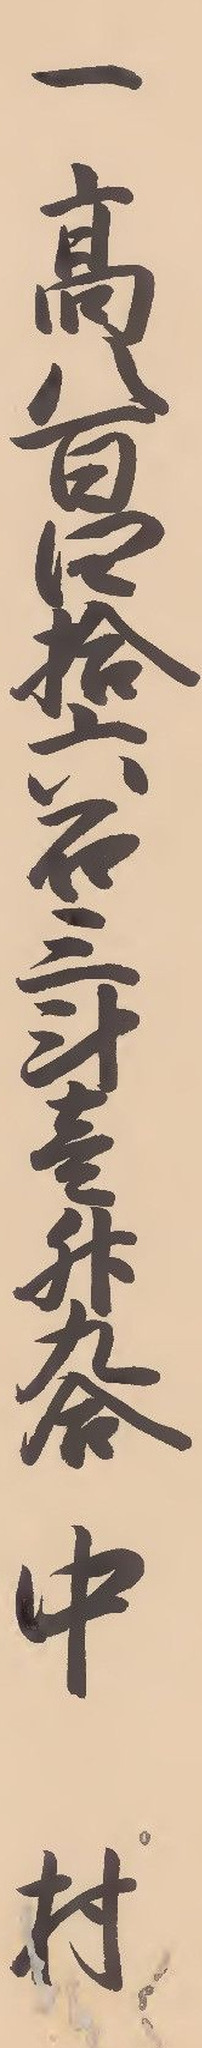一髙八百四拾六石三斗壱升九合中村
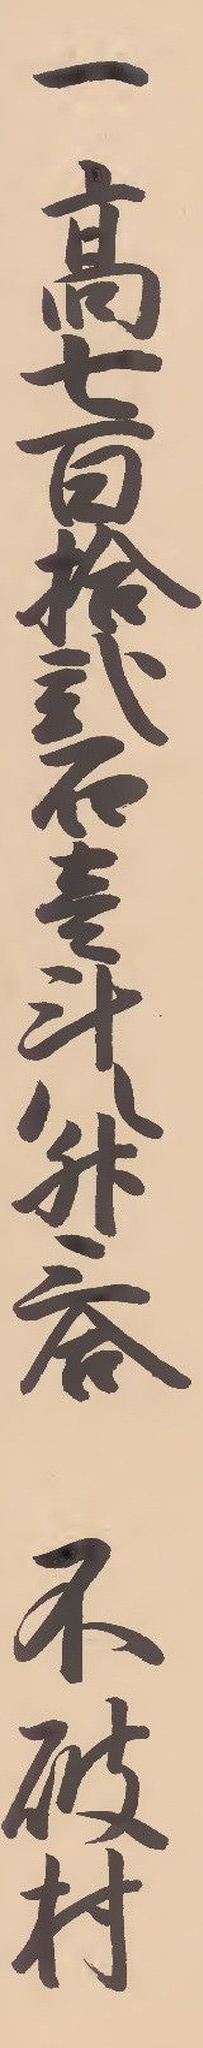一髙七拾弐石壱斗八升三合不破村
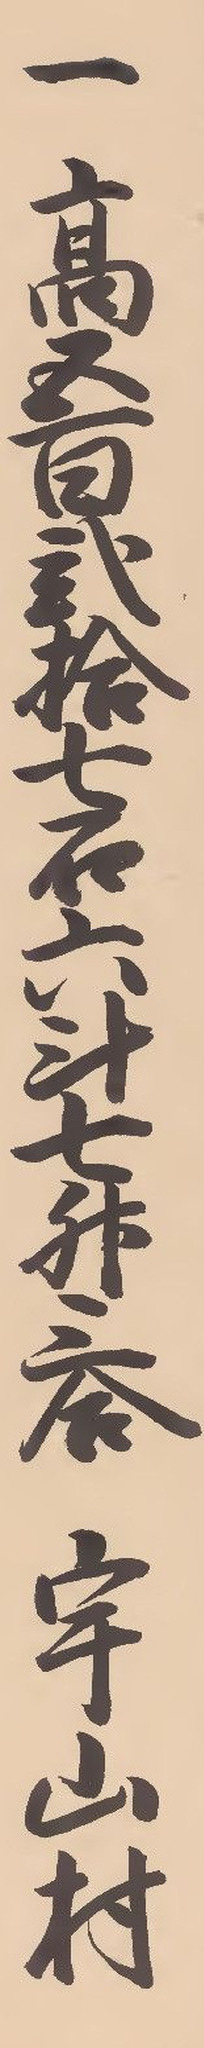一髙五百弐拾七石六斗七升三合宇山村
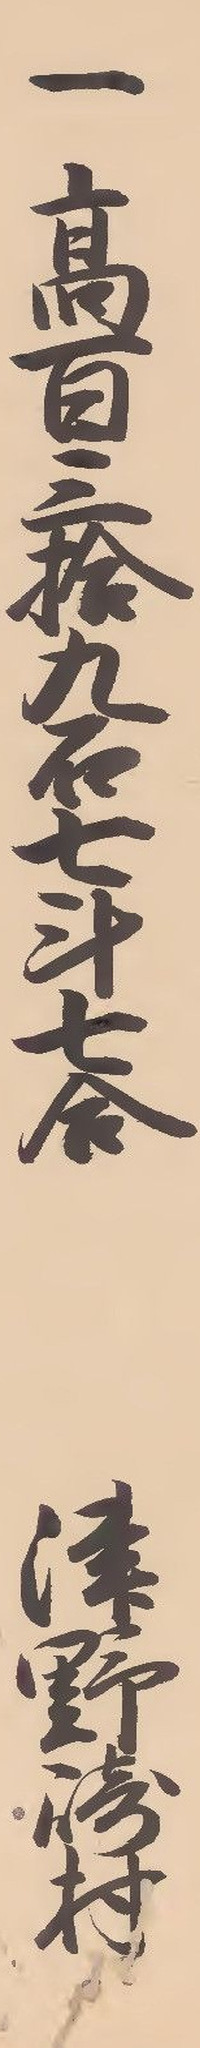一髙百三拾九石七斗七合津野崎村
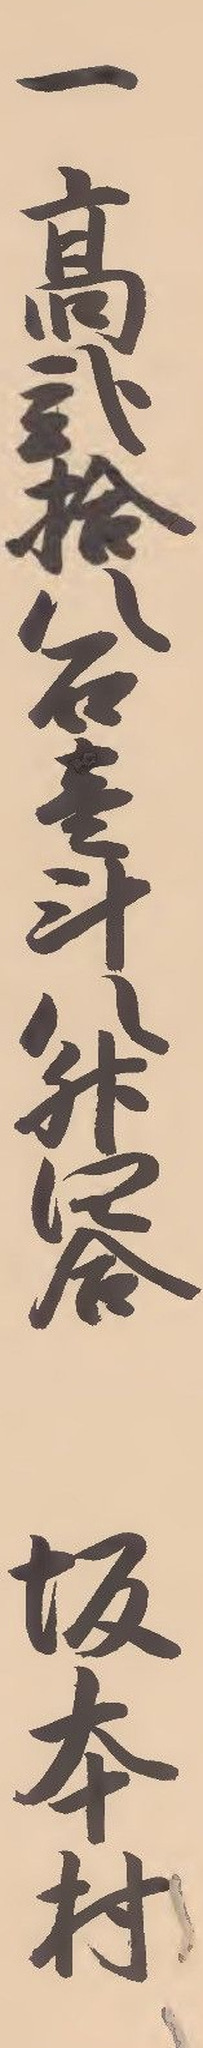一髙弐拾八石壱斗八升四合坂本村
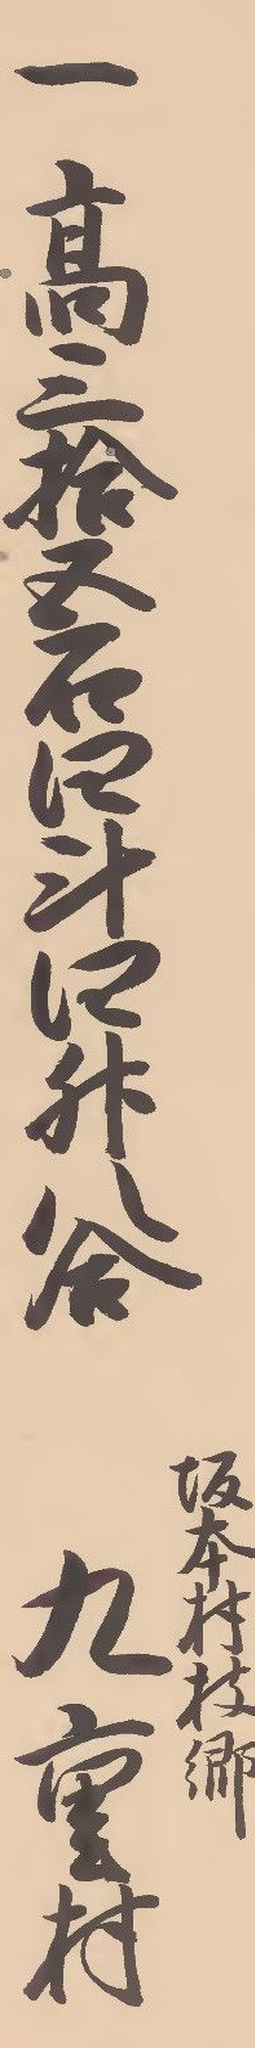一髙三拾五石四斗四升八合九重村

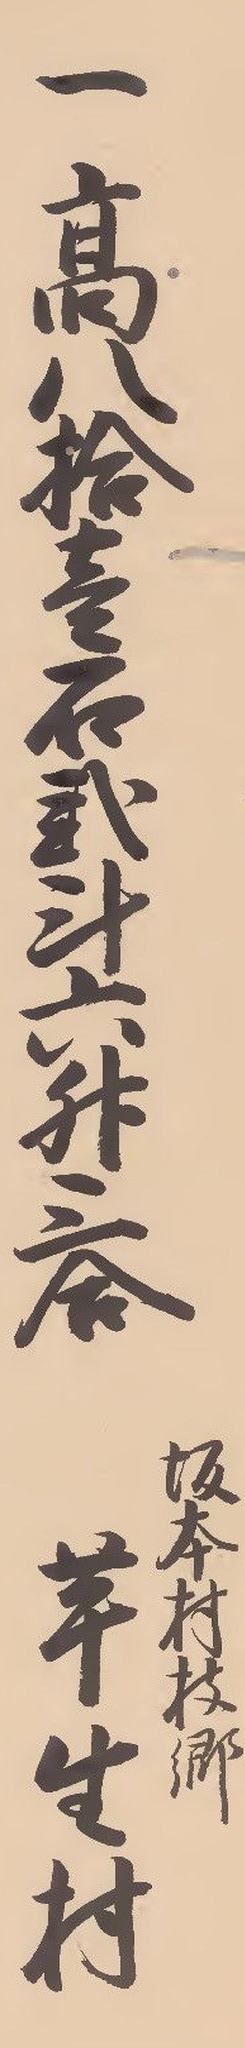一髙八拾壱石弐斗六升三合芋生村
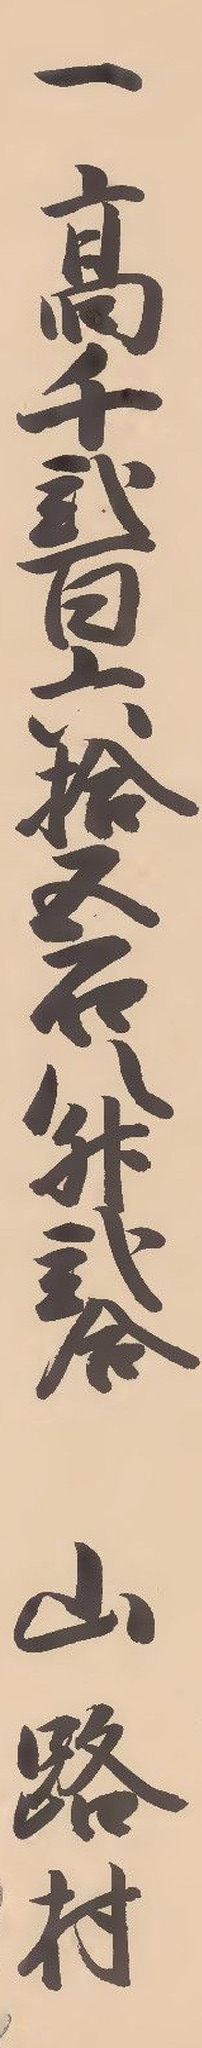一髙千弐百六拾五石八升弐合山路村
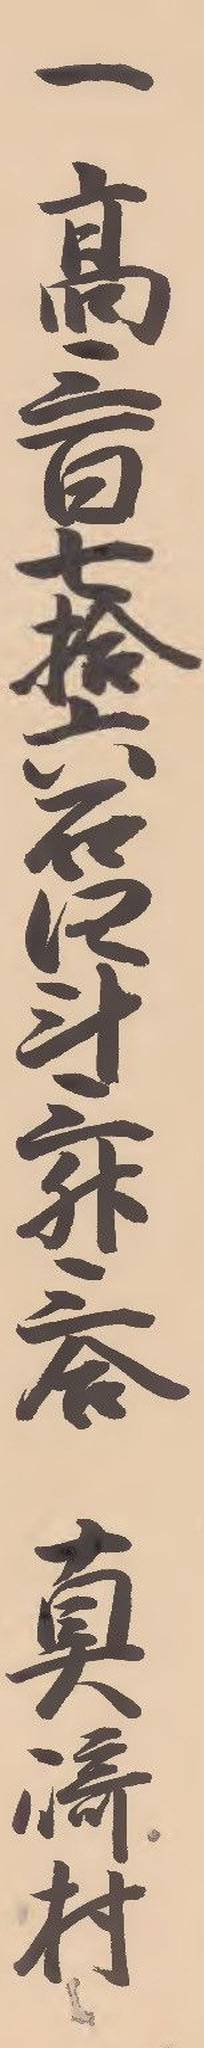一髙三百七拾六石四斗三升三合真崎村
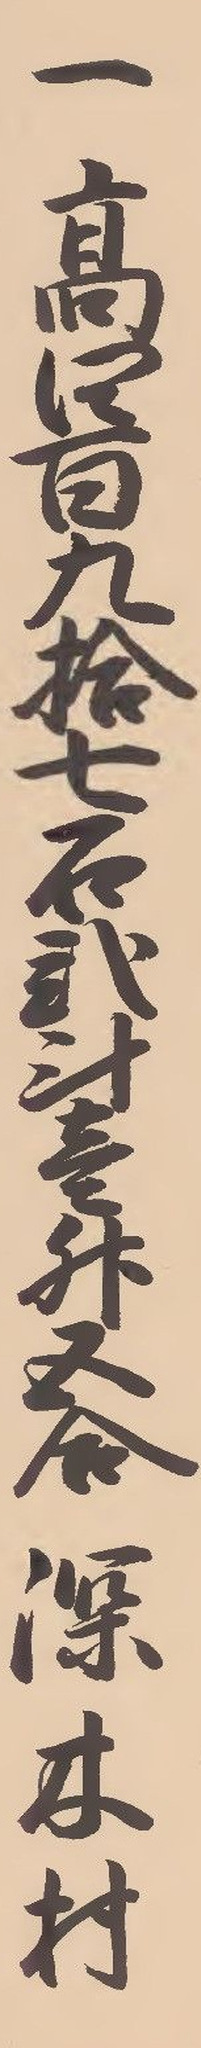一髙四百九拾七石弐斗壱升五合深木村
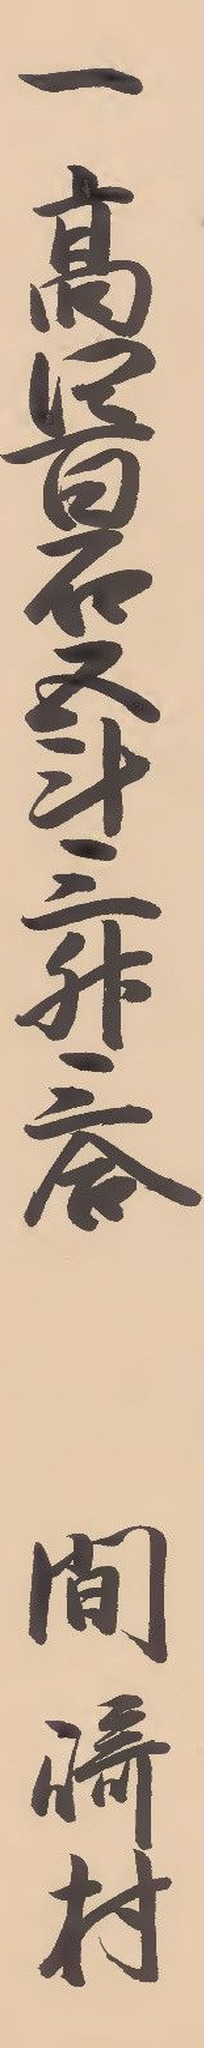一髙四百石五斗三升三合間埼村
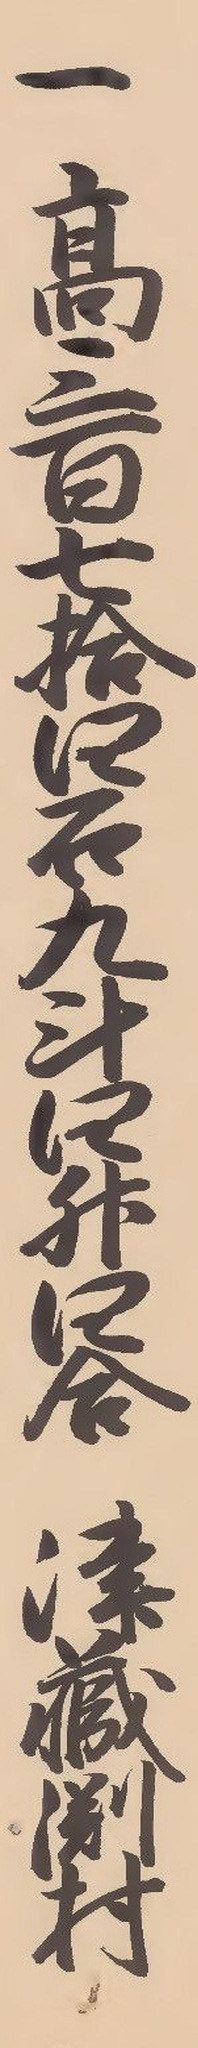一髙三百七拾四石九斗四升四合津藏渕村
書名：土佐国郷帳
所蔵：国立公文書館 National Archives of Japan
